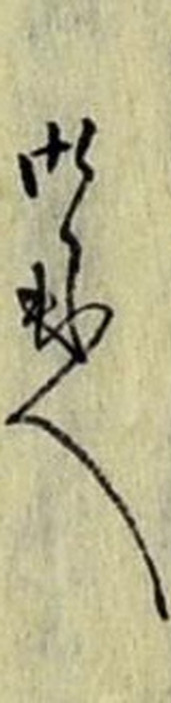御用人
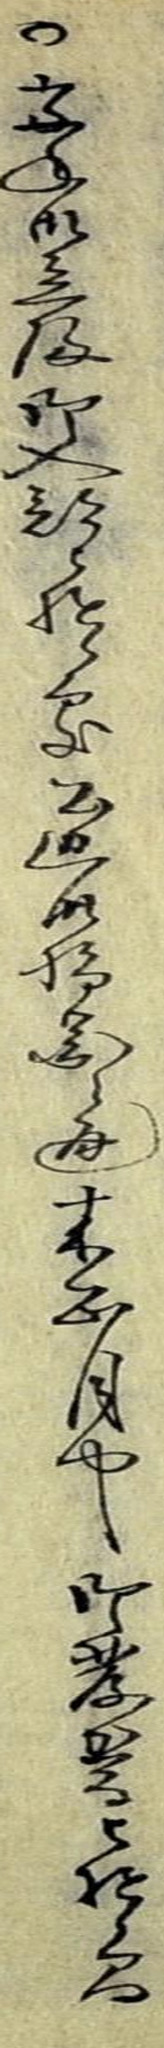○当年御立帰御入部被遊候処公辺御指図之通来正月中御発駕被遊候間
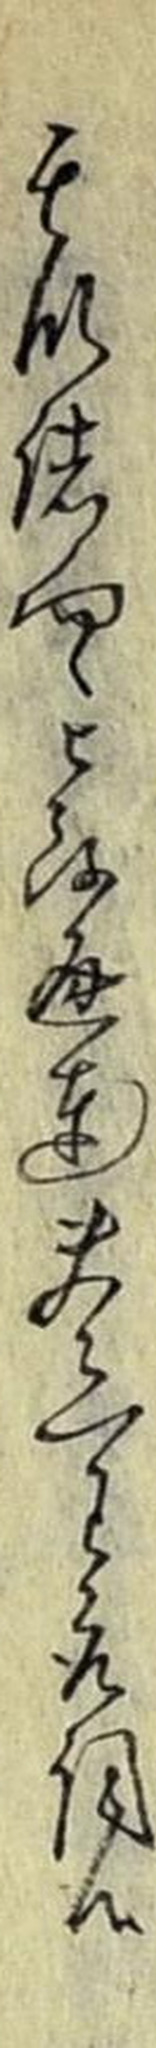其段諸向へ被致通達夫々可被取調候
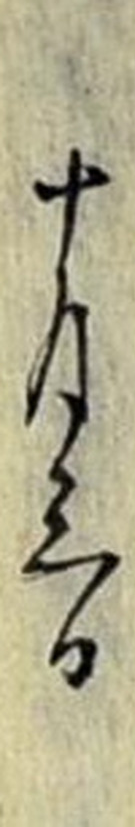十月三日
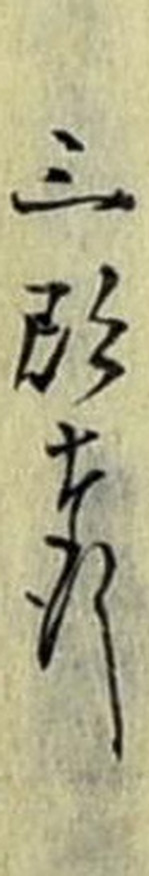三郡奉行
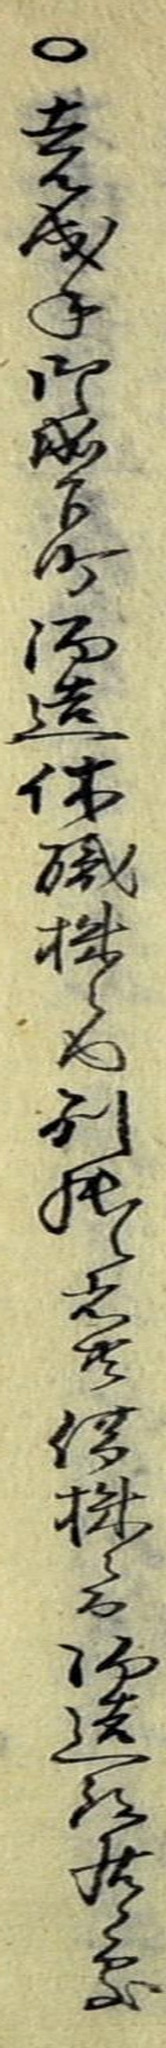○去ル戌年御城下町酒造休職株之内別紙之者共借株に而酒造致居候処

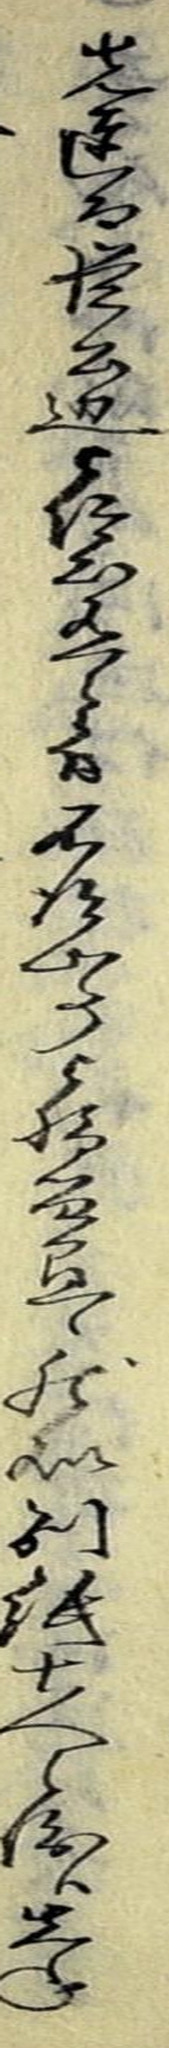先達而従公辺被仰出有之に付不得止事被指留置候然処別紙十人之儀は先年
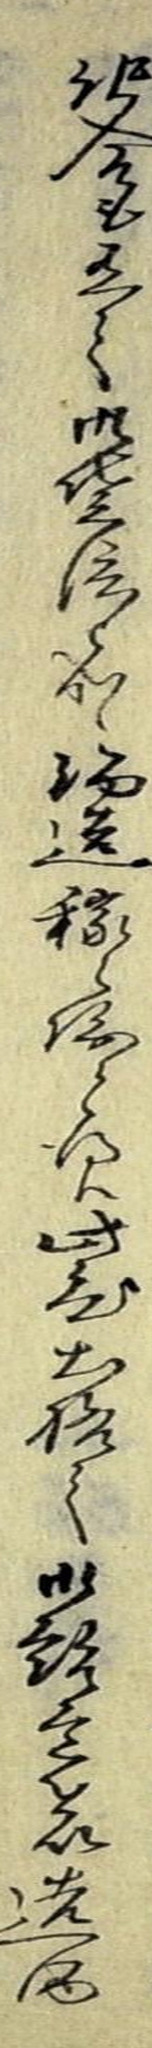訳合も有之御貸渡被成候酒造稼之儀に候得は此度出格之御趣意を以造酒
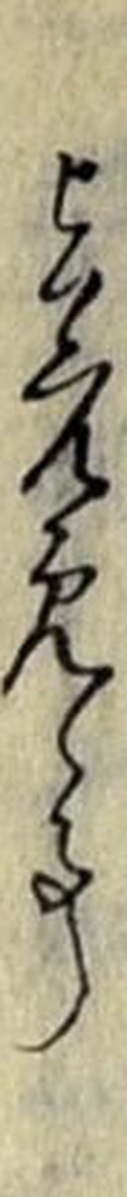被差免候事
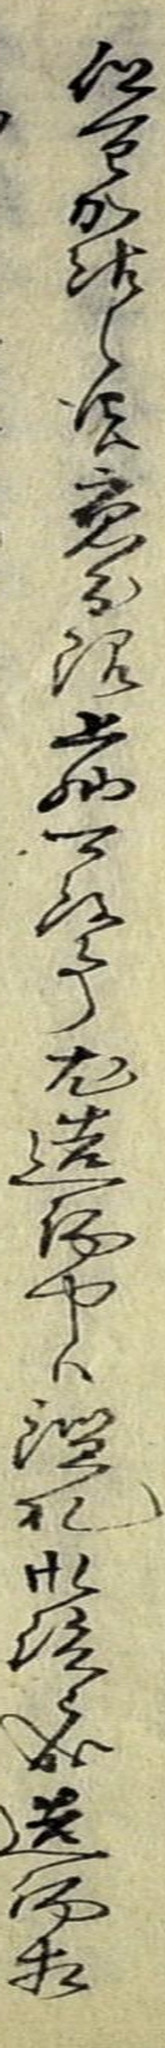但冥加銀之儀は応分限上納可致事尤造酒中は鑑札御渡被成造酒相
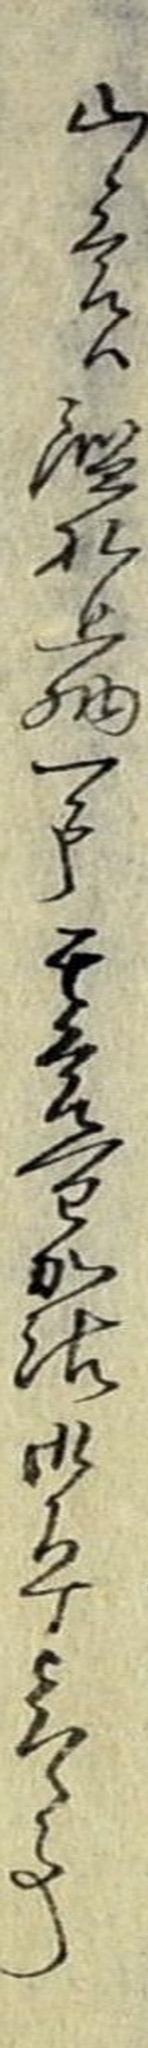止候節は鑑札上納可申其節冥加銀御下ヶ被下候事
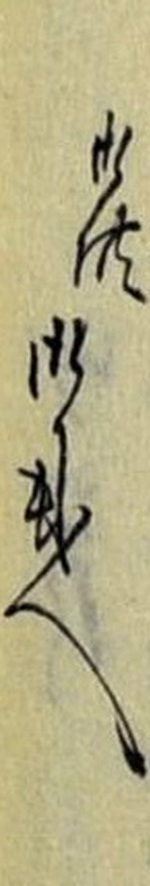御用人
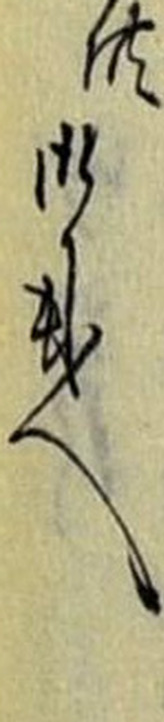御用人
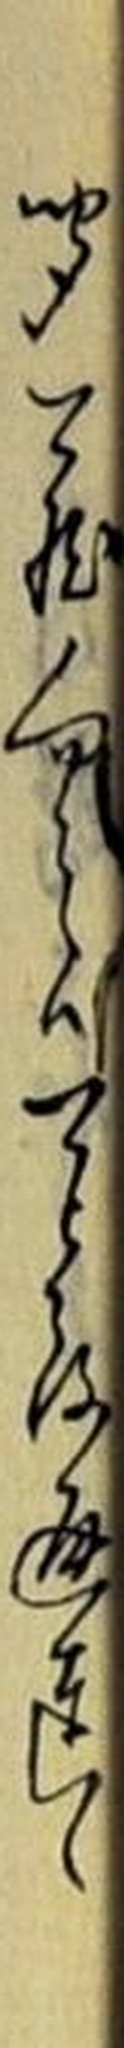聞可然向々は可被致通達候
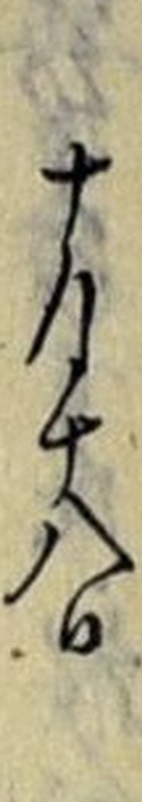十月十八日
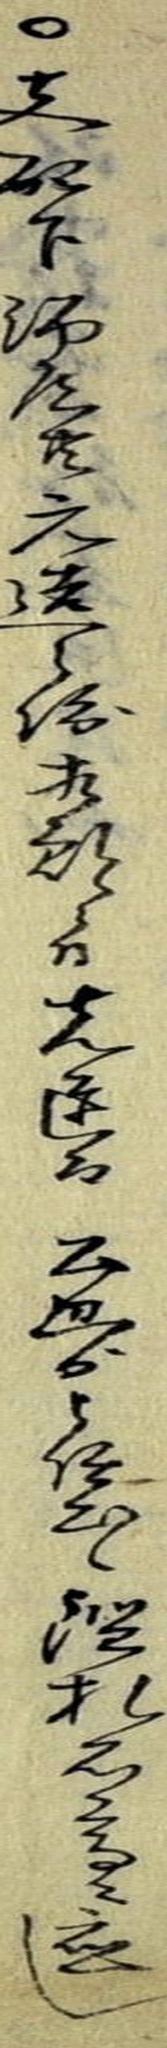○支配下酒屋共元造之儀相願候に付先達而公辺ゟ被仰出候鑑札石高に応し
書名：命令之部 六
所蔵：福井県文書館 Fukui Prefectural Archives
